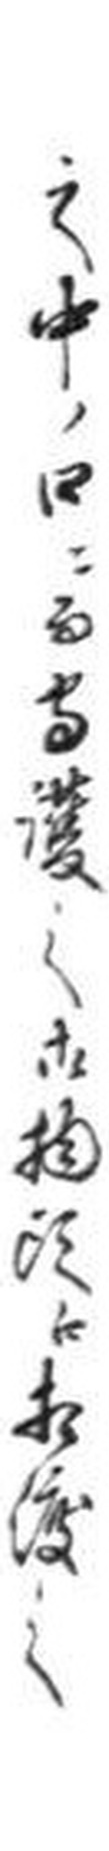之中ノ口ニ而守護之御物頭江相渡之
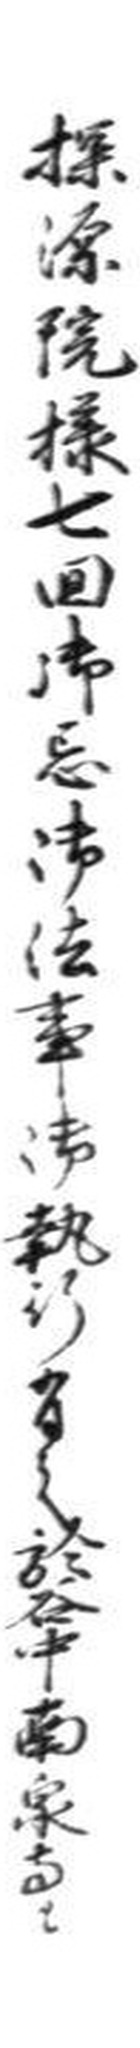探源院様七回御忌御法事御執行有之於谷中南泉寺も
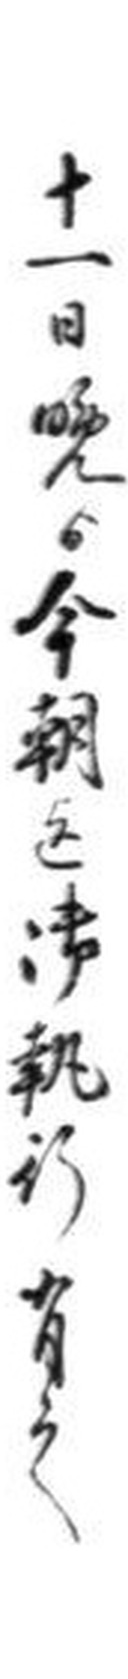十一日晩ゟ今朝迄御執行有之
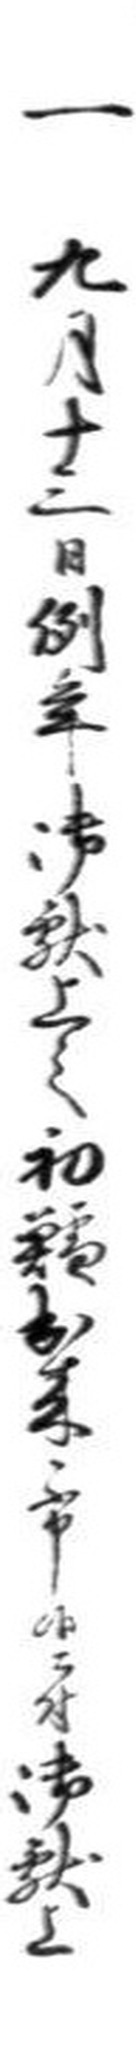一九月十三日例年御献上之初鱈出来不申候ニ付御献上
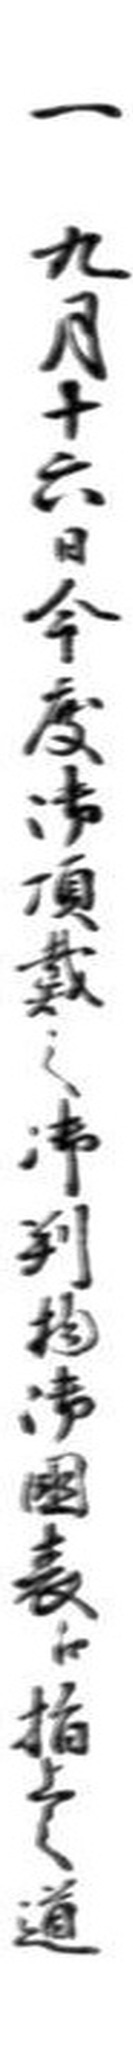一九月十六日今度御頂戴之御判物御国表江指上之道
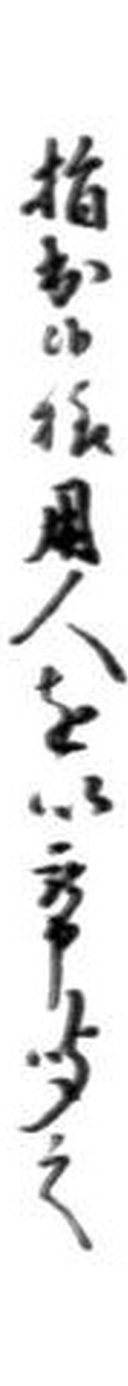指出候様用人を以被申聞之
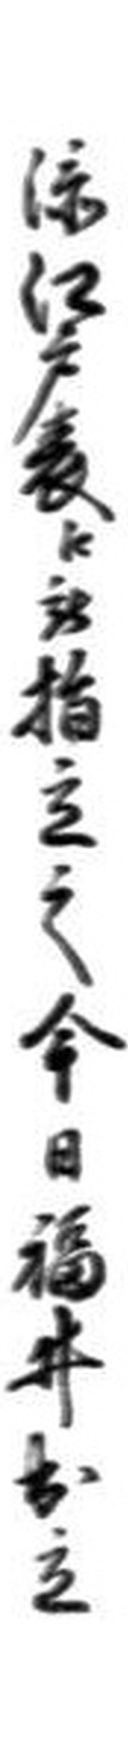添江戸表江被指立之今日福井出立

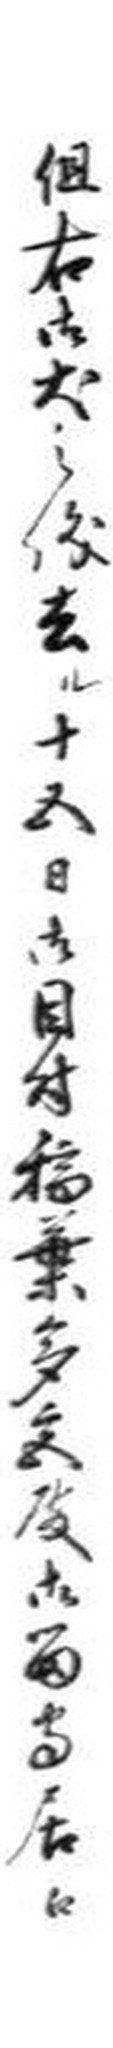但右御犬之儀去ル十五日御目付稲葉多宮殿御留守居江
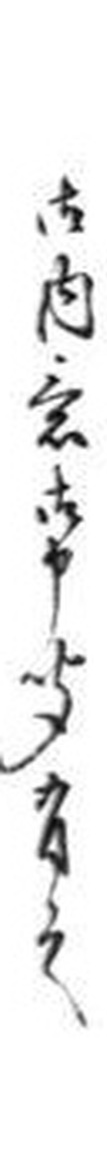御内意御申聞有之
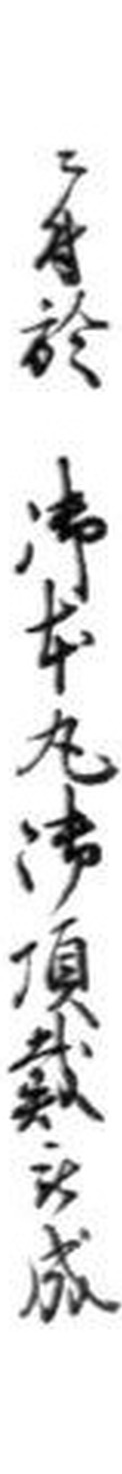ニ付於御本丸御頂戴被成
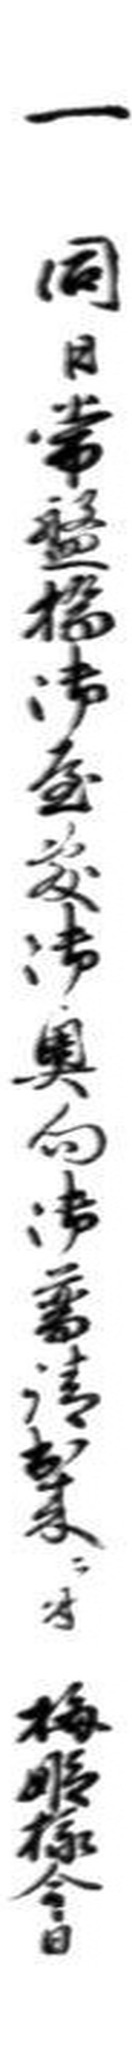一同日常盤橋御屋敷御奥向御普請出来ニ付梅姫様今日
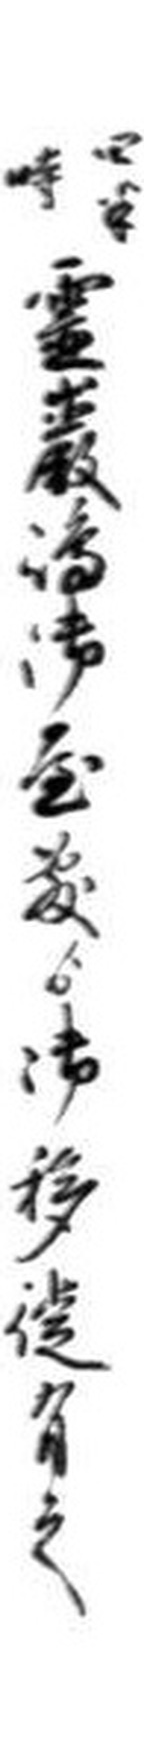時霊厳嶋御屋敷ゟ御移徒有之
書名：家譜 三十二 吉邦公 従享保二年到享保三年
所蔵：福井県文書館 Fukui Prefectural Archives
